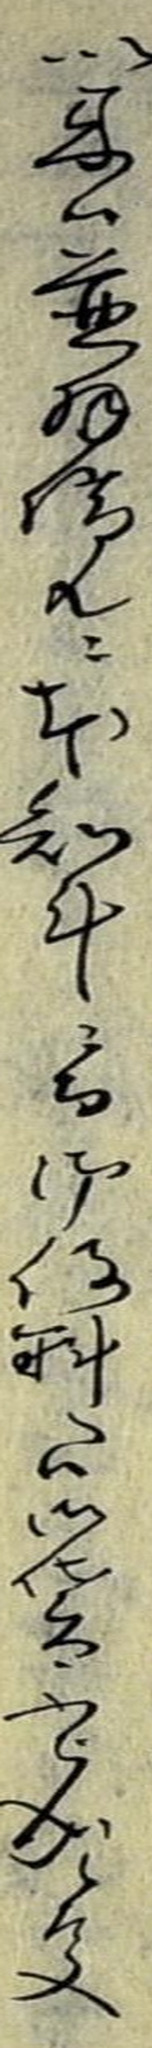以来は並拝借共に本知斗に而御役料へは御貸不被成候事
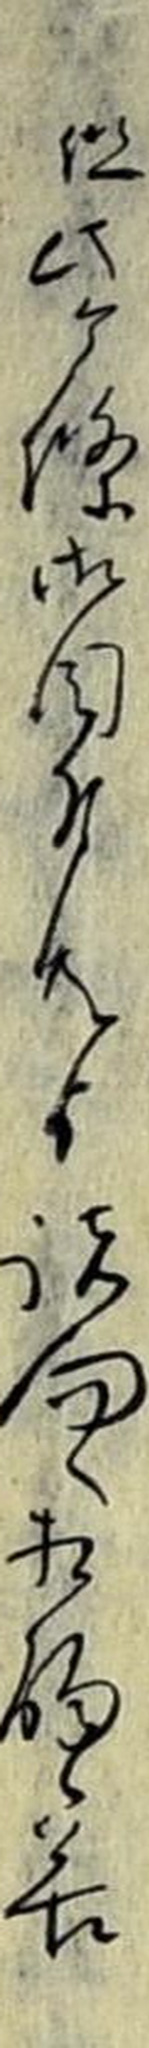但此ケ条御目付共ゟ諸向へ相触候筈
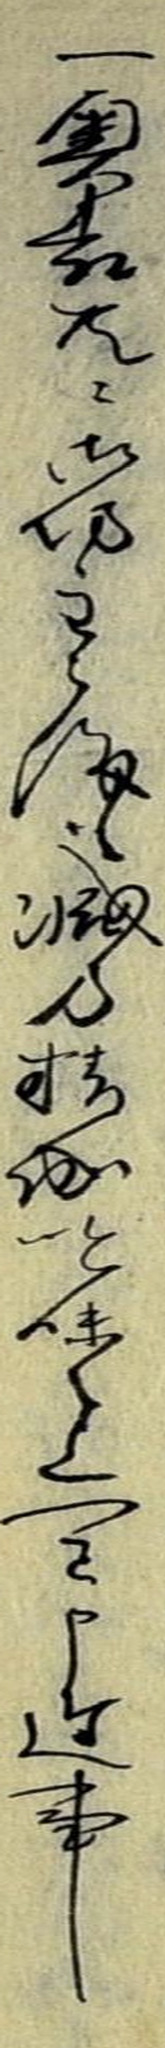一奥表共に御坊主之儀も減方精誠吟味之上可被申達事
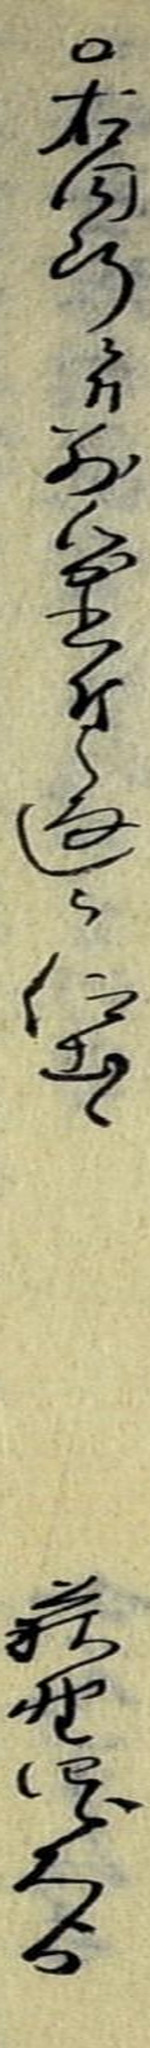〇右同断に付別紙書付之通被仰出候荻野四郎右衛門
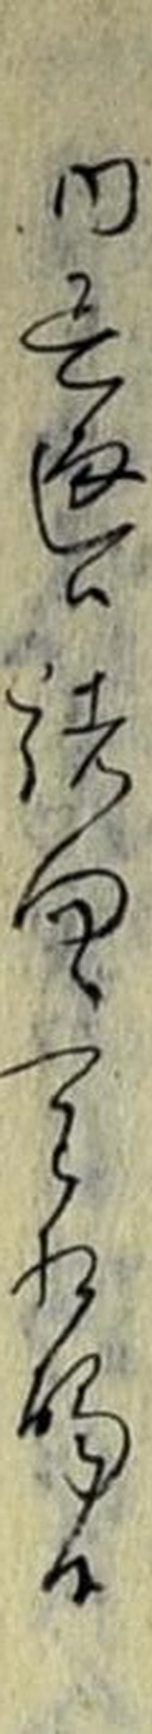内壱通は諸向へ可被相触候
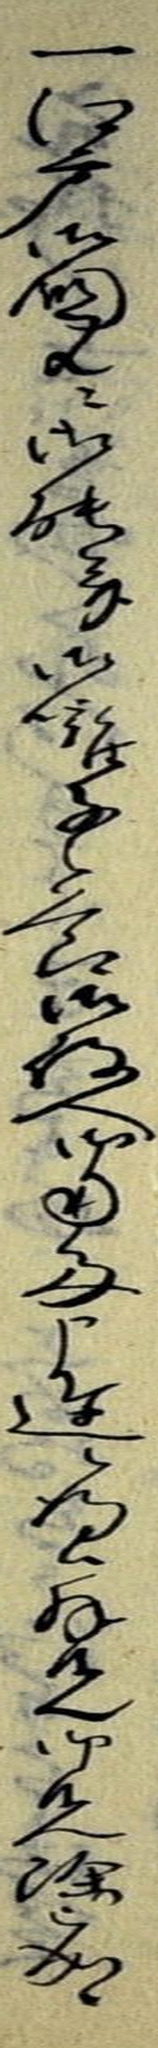一江戸御国共に御能并御囃子之節御役人御用多申達候得は拝見御見除被成候
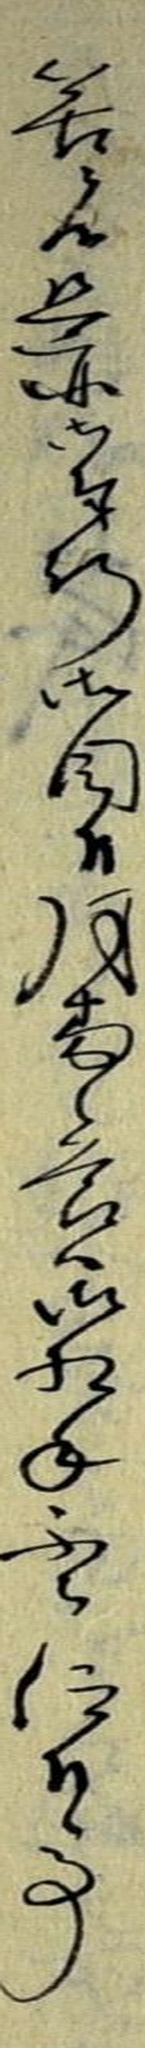筈に候且亦御奉行御目付月番之節は御相手不被仰付候事
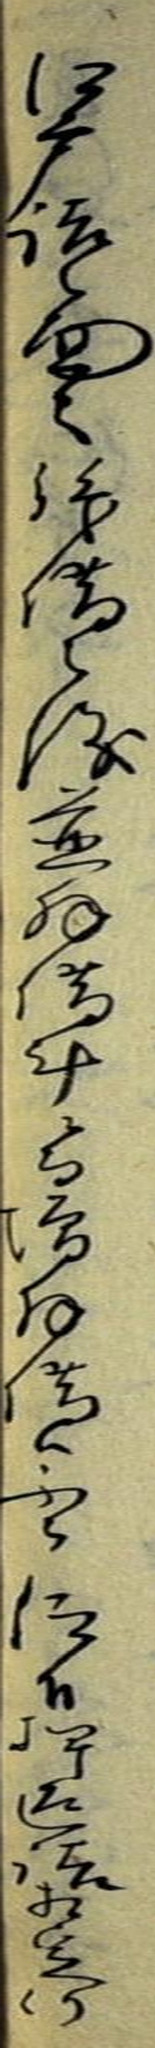江戸詰之面々拝借之儀並拝借斗に而増拝借は不被仰付押返詰相定り候
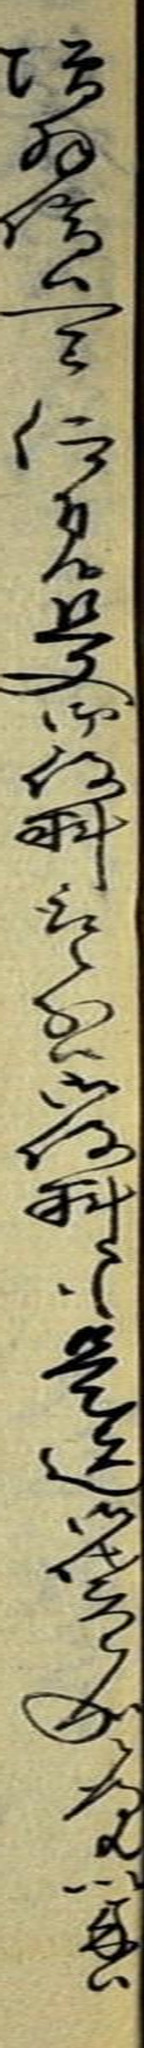増拝借は可被仰付候且又御役料取之分は御役料へも是迄御貸被成候得共以来は
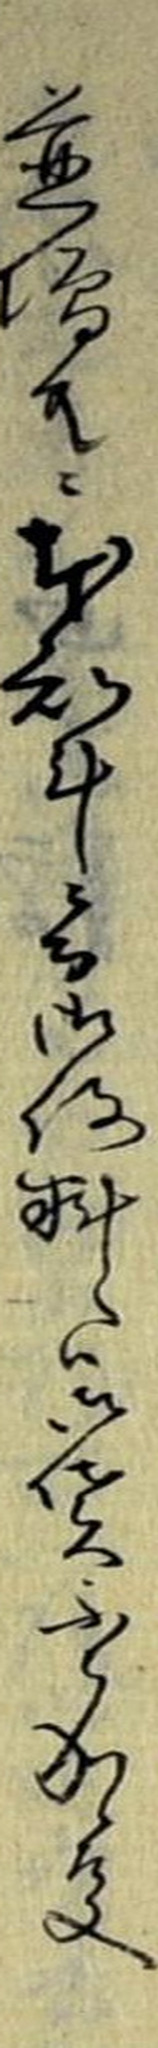並増共に本知斗に而御役料へは御貸不被成候事
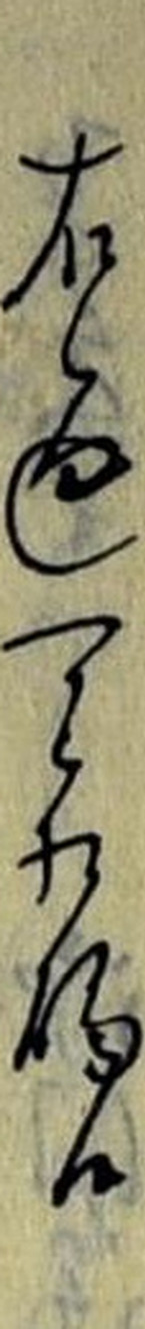右之通可被相触候
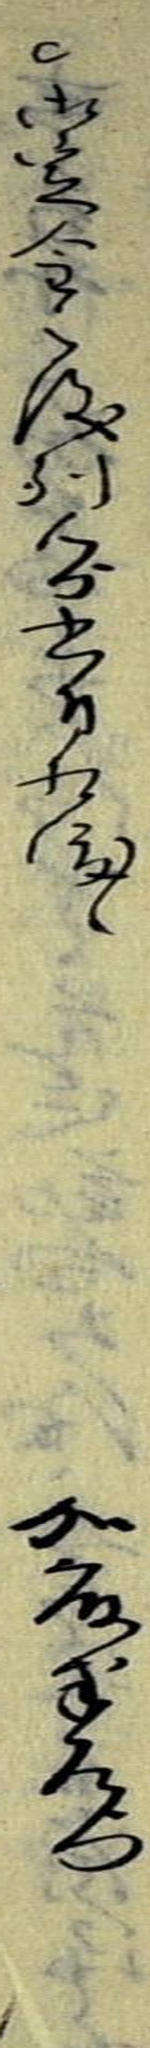〇御定金之儀別紙書付相渡候加藤半左衛門
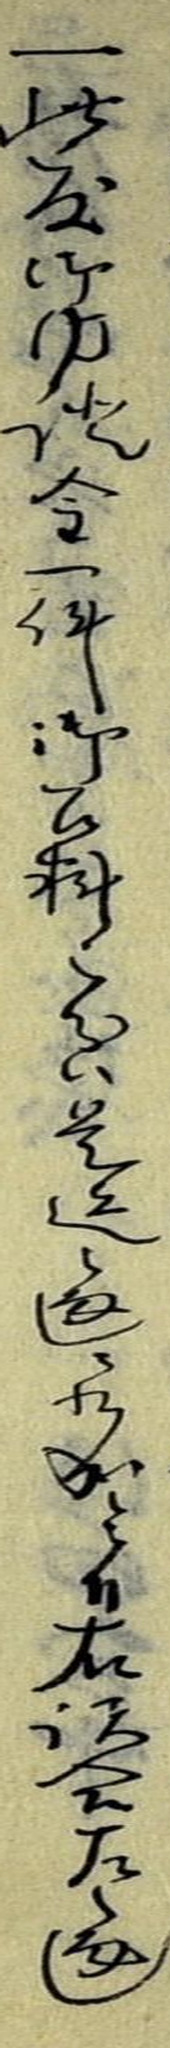一此度御内証金一件御召料之分は是迄之通に相成候に付右訳合左之通
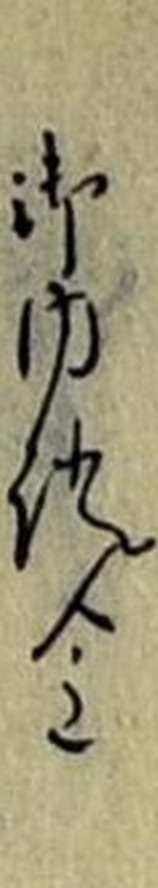御内証金
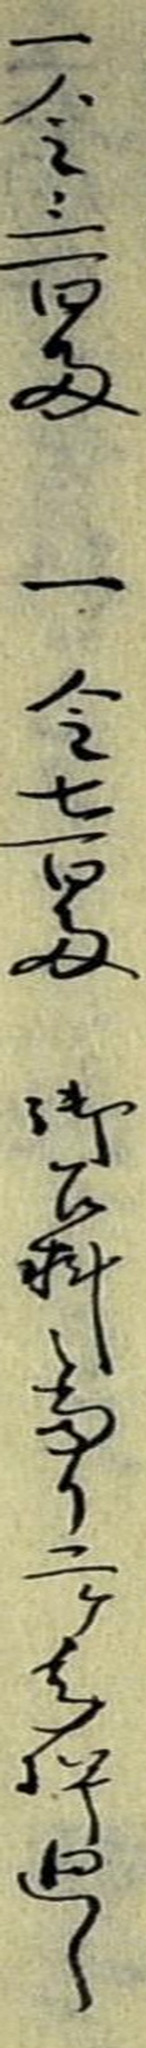一金三百両一金七百両御召料之当り二ヶ年押廻し
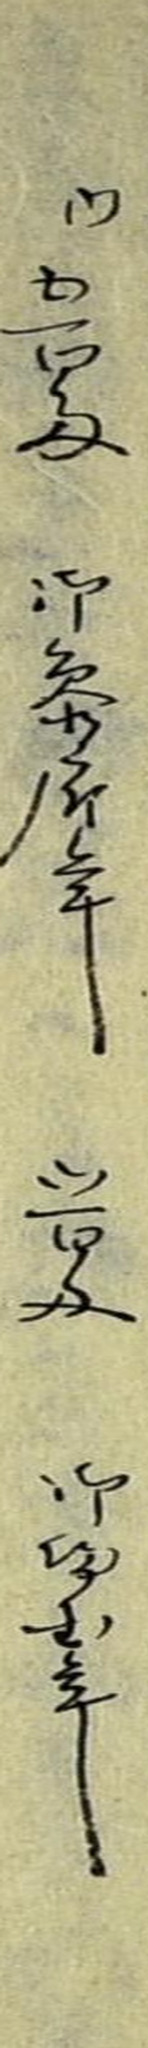内五百両御参府年弐百両御帰国年
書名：命令之部 二
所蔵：福井県文書館 Fukui Prefectural Archives
